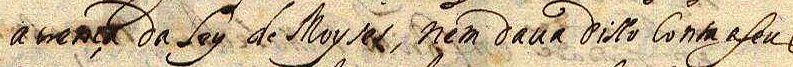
a crença da Ley de Moyses, nem daua disso conta a seus
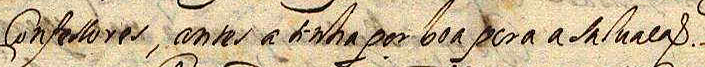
Confessores, antes a tinha por boa pera a saluacaõ.
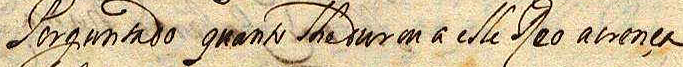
Perguntado quanto lhe durou a elle Reo a crença
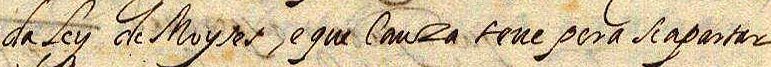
da Ley de Moyses, e que cauza teue pera se apartar
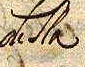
della.
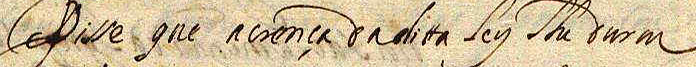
Disse que a crença da ditta ley lhe durou
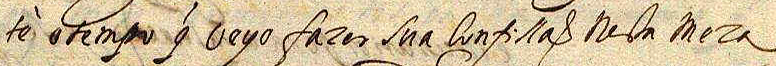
tè o tempo q̄ veyo fazer sua confissaõ nesta meza,
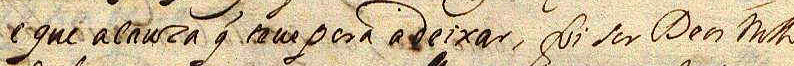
e que a cauza q̄ teue pera a deixar, foi ser Deos nosso
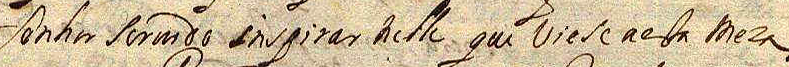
Senhor seruido inspirar nelle que viese a esta meza.
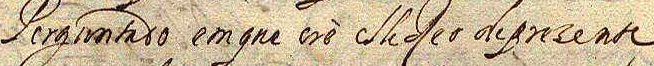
Perguntado em que crè elle Reo de prezente,
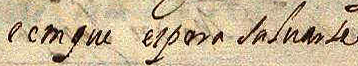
e em que espera saluarse.
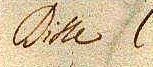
Disse
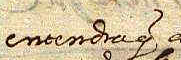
entendia q̄ a
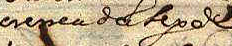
crenca da ley de
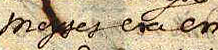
moyses era en
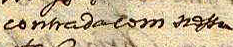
contrada com nossa
